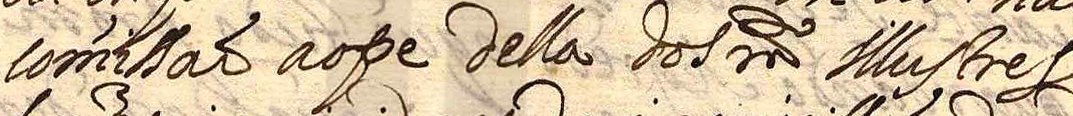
comissaõ ao pe della dos mto Illustres
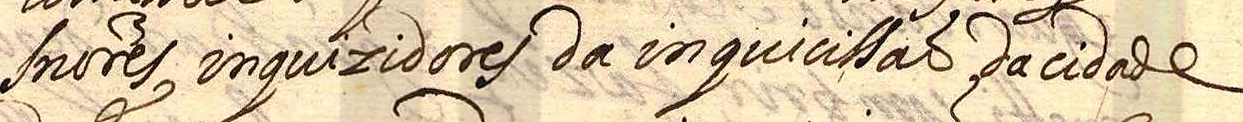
Snorēs inquizidores da inquicissaõ da cidade
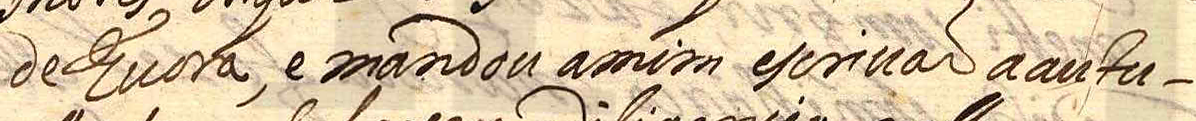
de Euora, e mandou a mim escriuaõ a autu
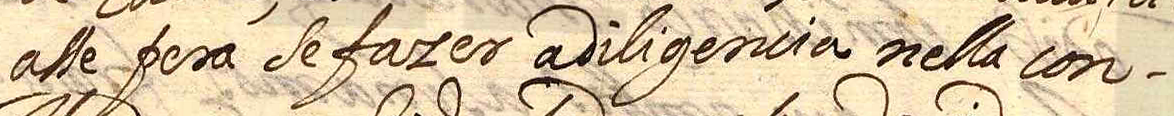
asse pera se fazer a diligencia nella con
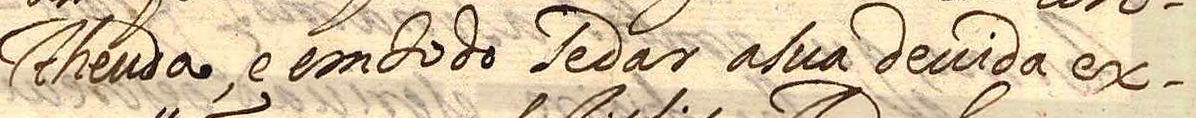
theuda, e em todo se dar a sua deuida ex
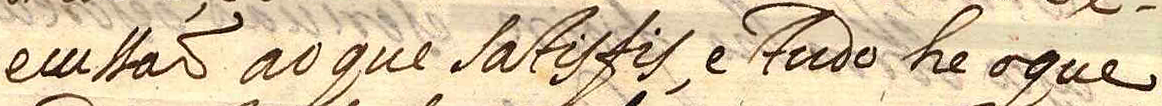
ecussaõ ao que satisfis, e tudo he o que
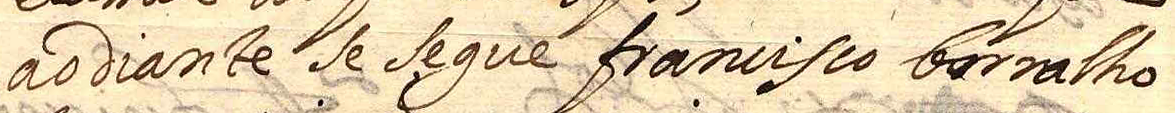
ao diante se segue francisco borralho
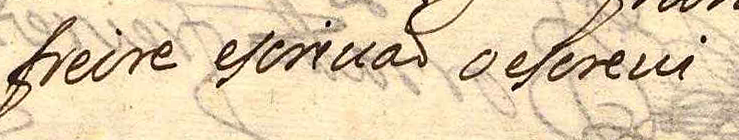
freire escriuaõ o escreui
